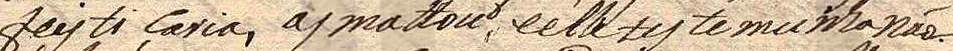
feytiçaria, as mattou, e ella testemunha não
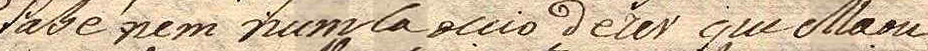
sabe nem numCa ouio dezer que ella ou
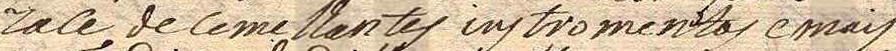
zace de cemelhantes instromentos e mais
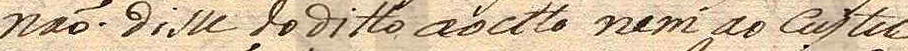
naõ. disse do ditto aoctto nem ao custu
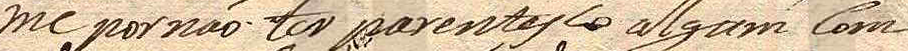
me por naõ ter parentesco algum Com
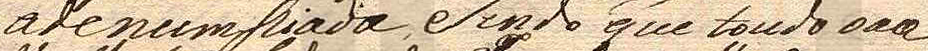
a denumssiada, sendo que toudo o ao
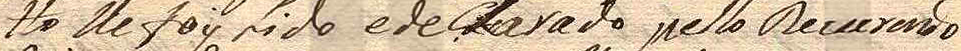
tto lhe foy Lido e decLarado pello Reuerendo
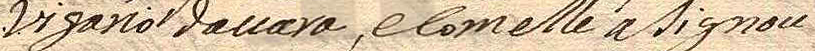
vigario da uara, e com elle asignou
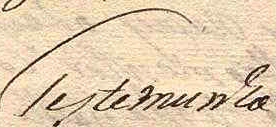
Testemunha
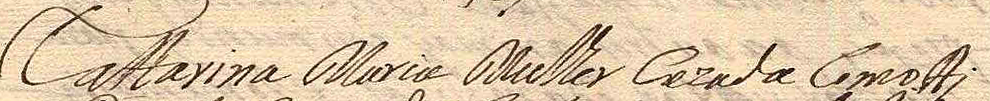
Catharina Maria Mulher Cazada Com o Aj
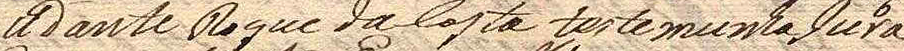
udante Roque da Costa testemunha Jura
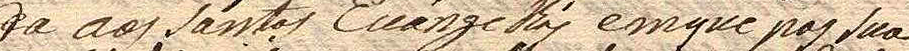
da aos santos Euangelhós em que pos sua
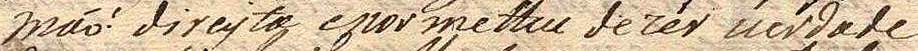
mão: direyta e pormetteu dezer uerdade
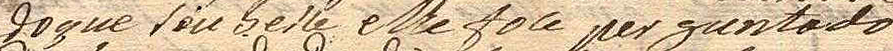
do que soubesse e lhe foce perguntado
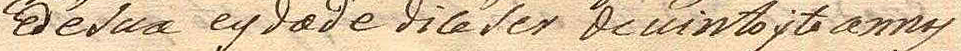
de sua eydade dice ser de uintoyto annos
